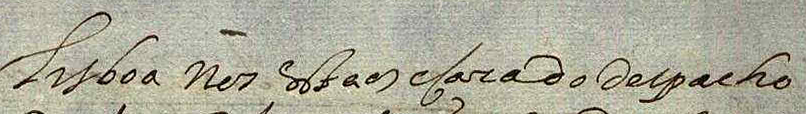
Lisboa nos Estaos e Caza do despacho
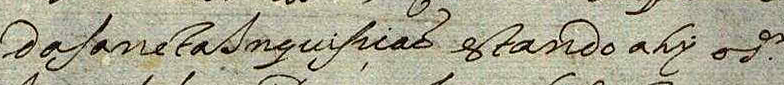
da sancta Inquisiçaõ estando ahy o sor.
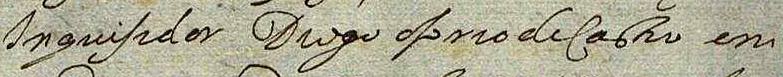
Inquisidor Diogo osorio de Castro em
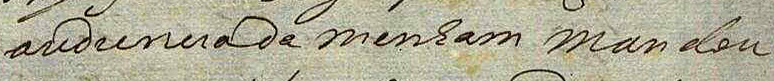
audiencia da menham mandou
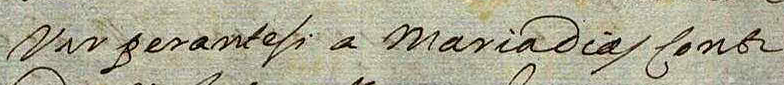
vir perante si a maria dias Conti
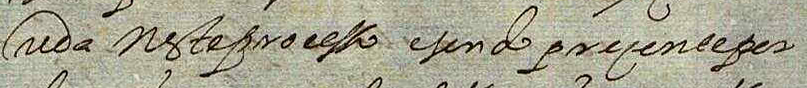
uda neste processo e sendo prezente por
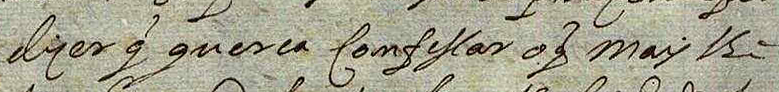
dizer q̄ queria Confessar o q̄ mais lhe
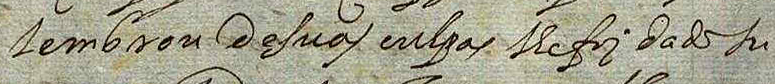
lembrou de suas culpas lhe foj dado Iu
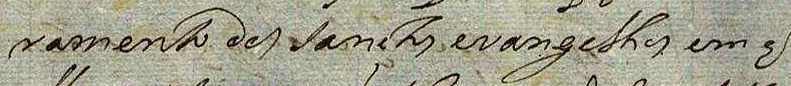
ramento dos sanctos evangelhos em q̄
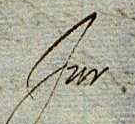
Jur
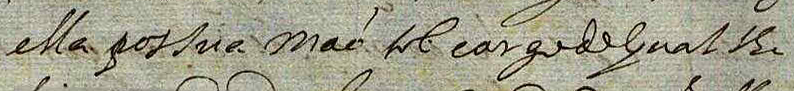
ella pos sua maõ sob cargo do qual lhe
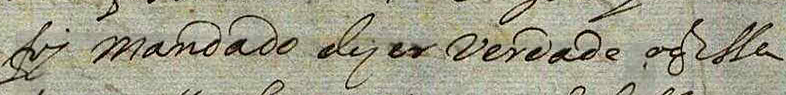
foj mandado dizer verdade o q̄ ella
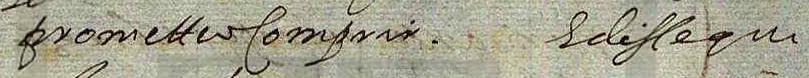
prometteo Comprir. E disse que
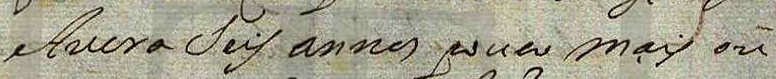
Auera seis annos pouco mais ou
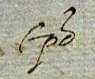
tpō
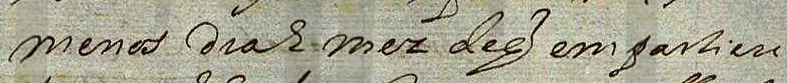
menos dia E mez de q̄ em particu
